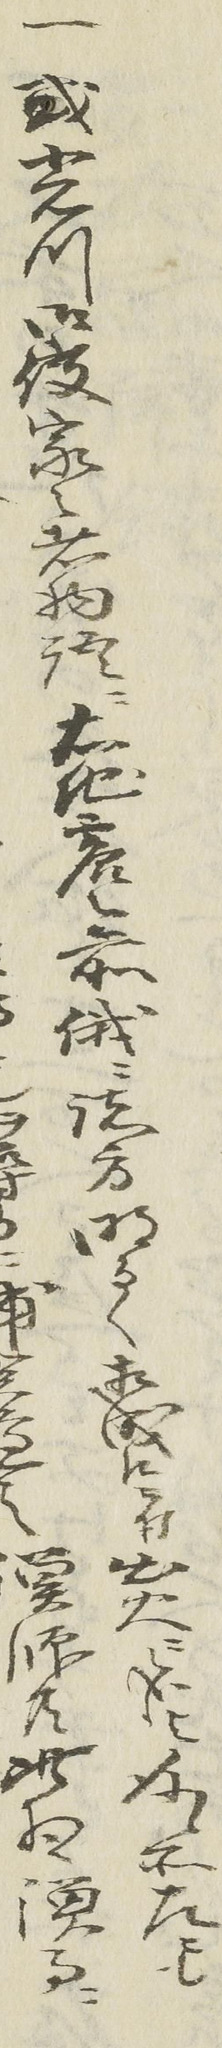一或小石川御役家之者物語二右地震之前俄二諸方明るく相成候二付出火二候哉と存候所左二も
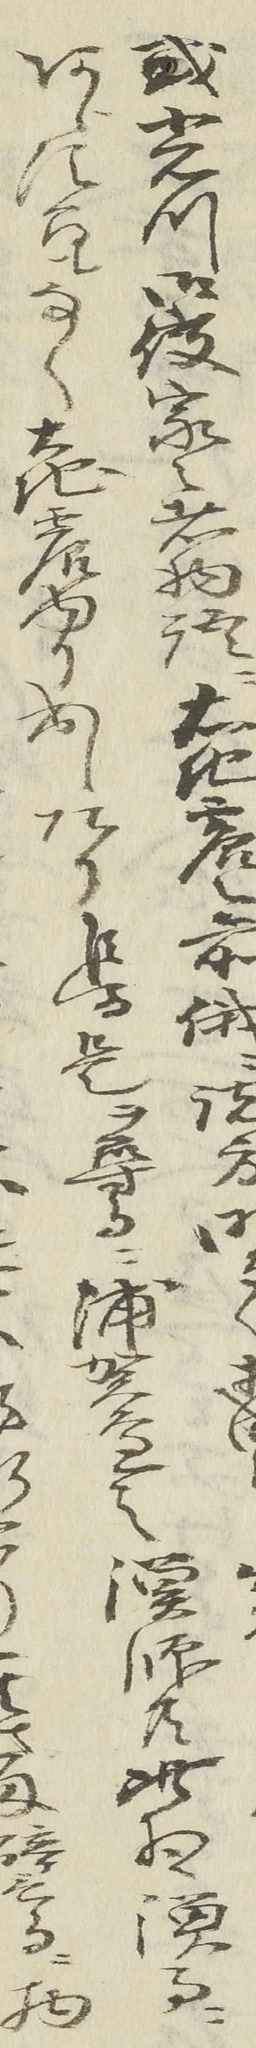あらすまもなく大地震ゆり出したり追而是ヲ尋る二浦賀辺之漁師共此夜漁事二
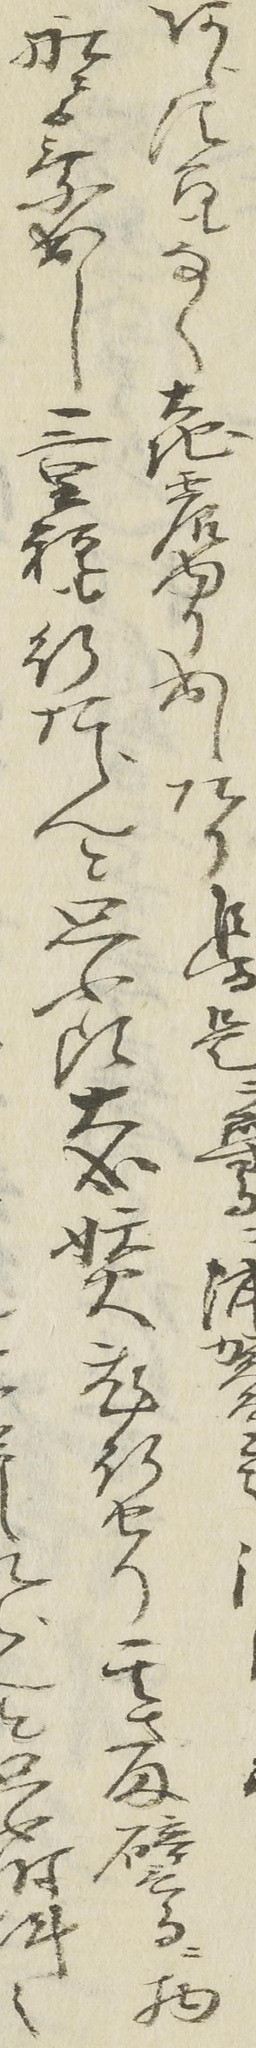船二而乗出し三里程行たらんと思ふ頃大成妖火飛行せり其さま譬る二物
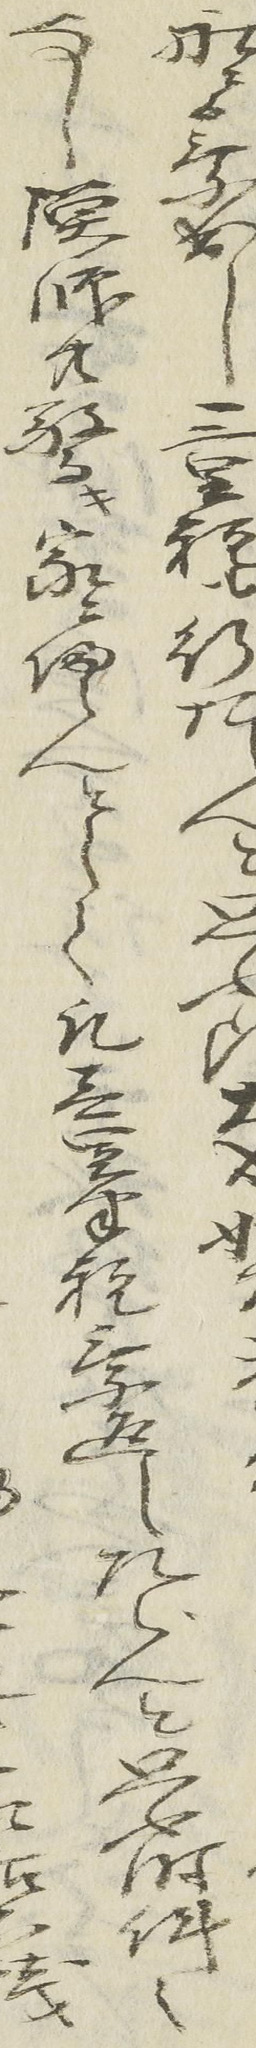漁師共驚キ家二帰らんとして凡壱里半程乗返したらんと思ふ時件之
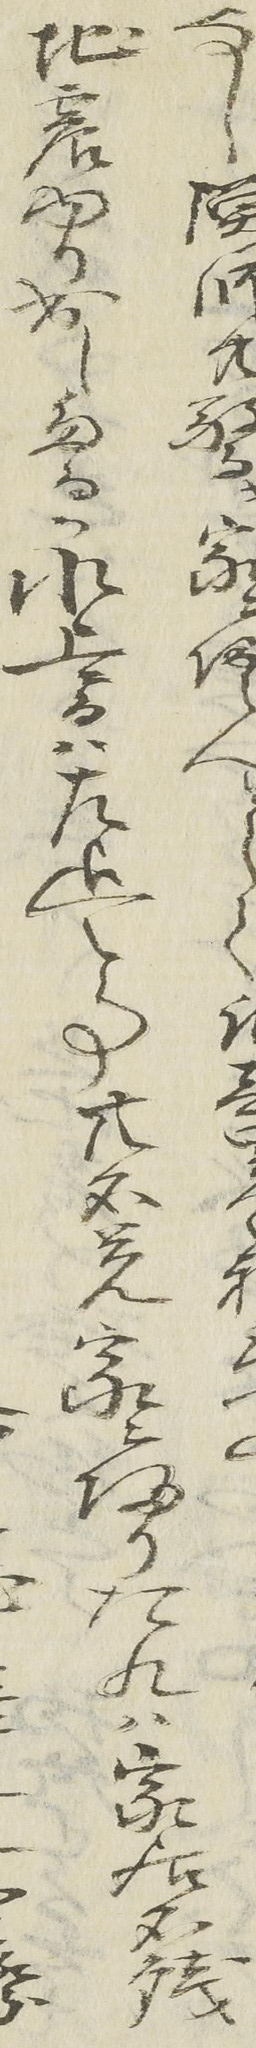地震ゆり出したる二水上二而ハ左迄之事共不覚家二帰たれハ家居不残
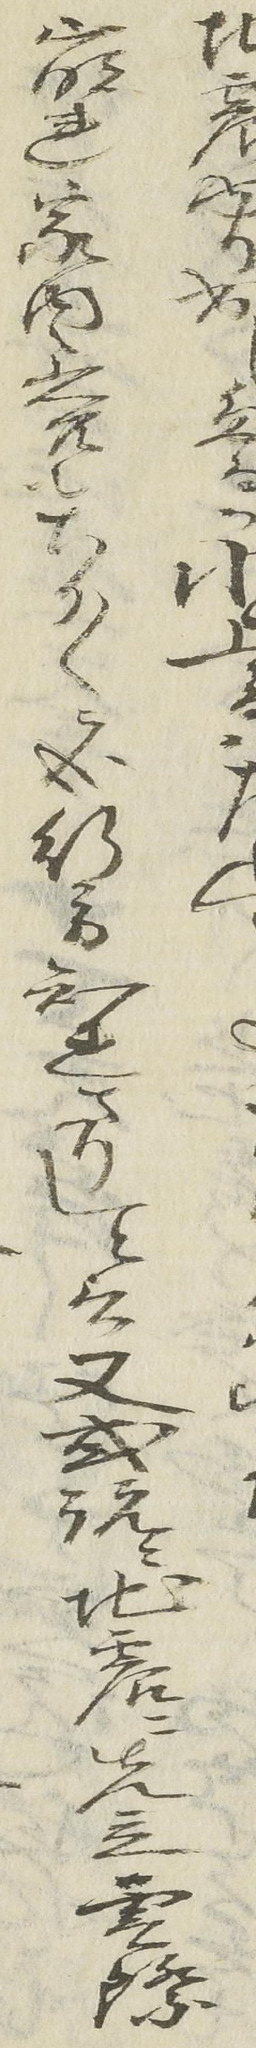潰れ家内之者共もちり〳〵二成行方知れさりしと云又或説二地震二先立雪降
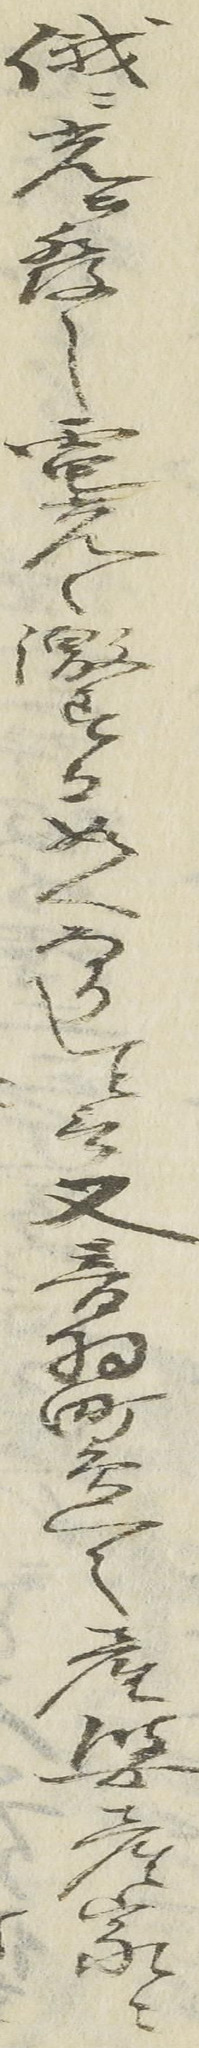俄二光ヲ発し電光之激する如くなりしと云又音羽町辺之産婆産家二
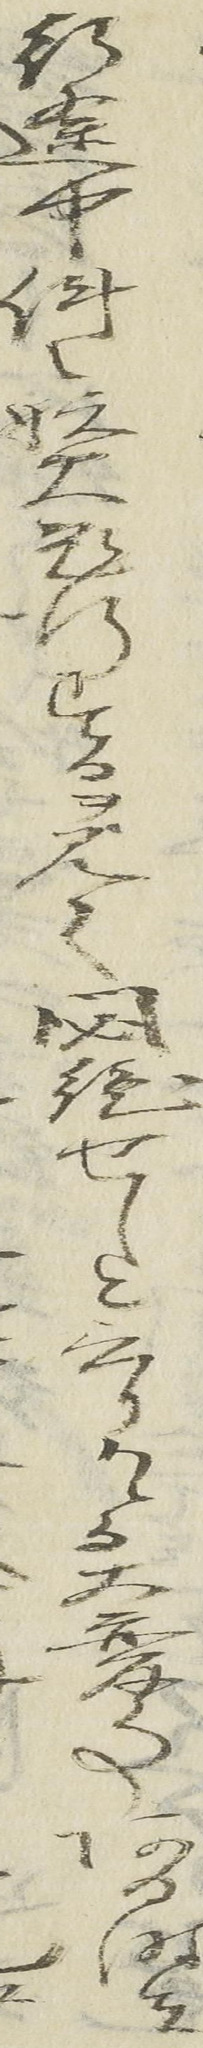行途中件之妖火飛行するヲ見て悶絶せしと云りける大変事ある時は
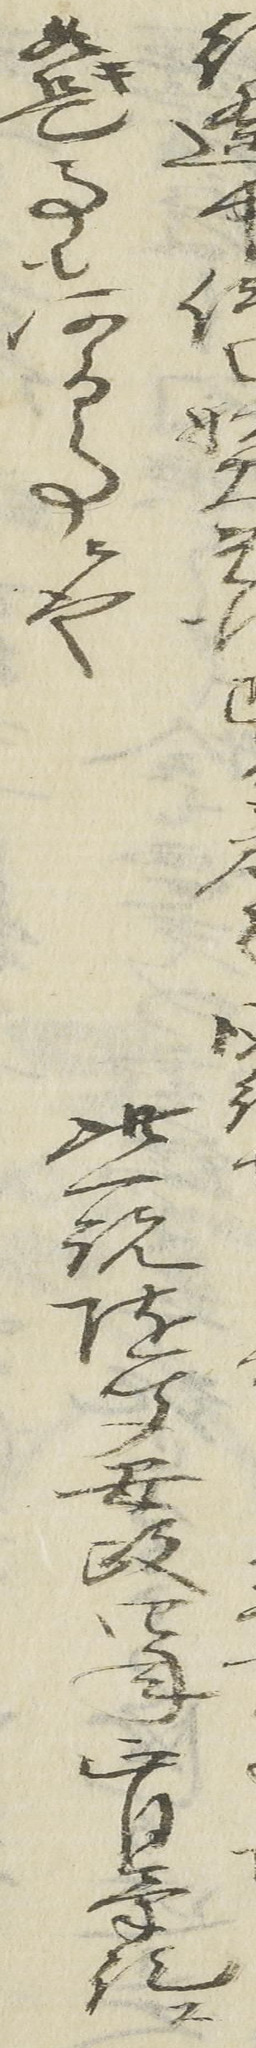如キ是事もある事二や此一説随聞安政四年正月予記ㇲ

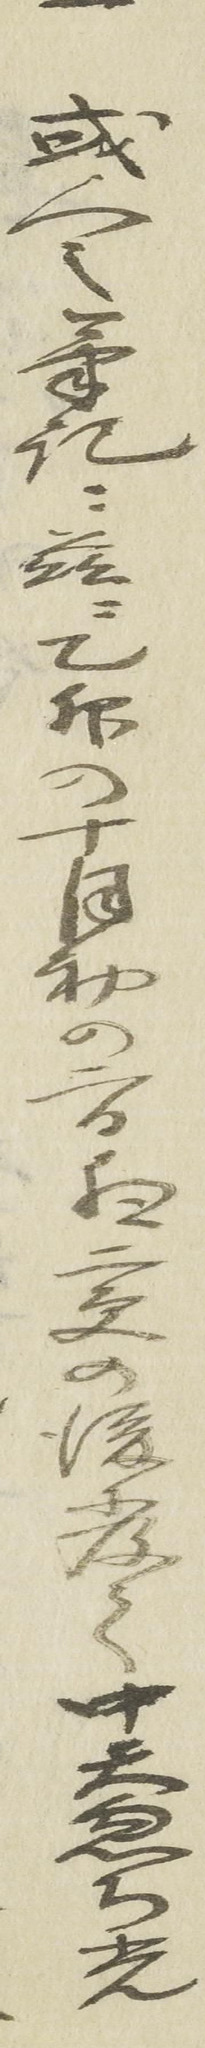一或人之筆記ニ茲ニ乙卯の十月初の二日夜二更の後に及て中天忽ち光
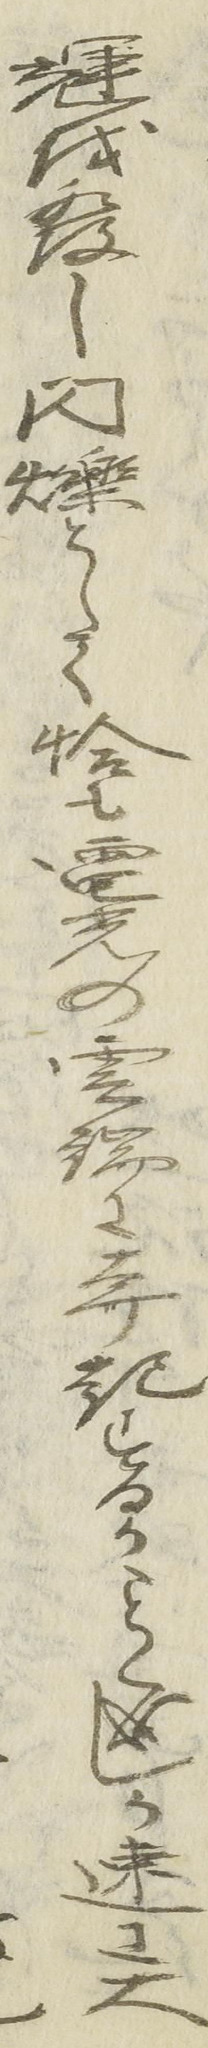輝を発し閃爍としたく恰も電光の雲端に奔起するかと成しか速に大
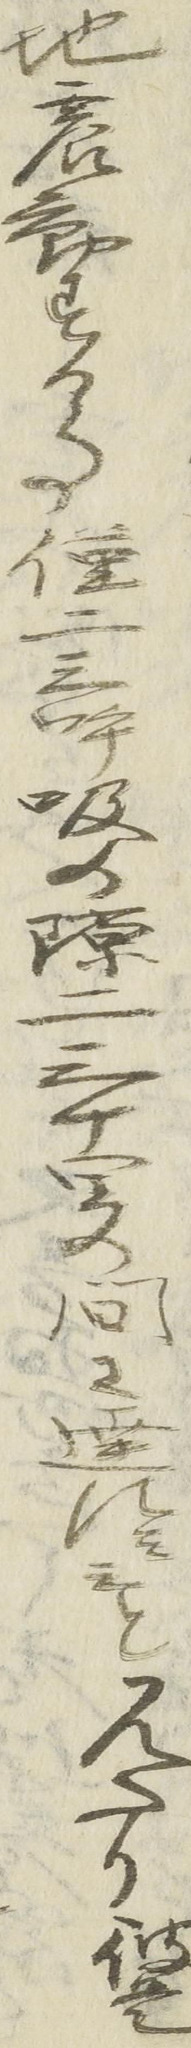地震動する事僅二三呼吸の隙ニ三十里の間に達す云々と見たり彼是
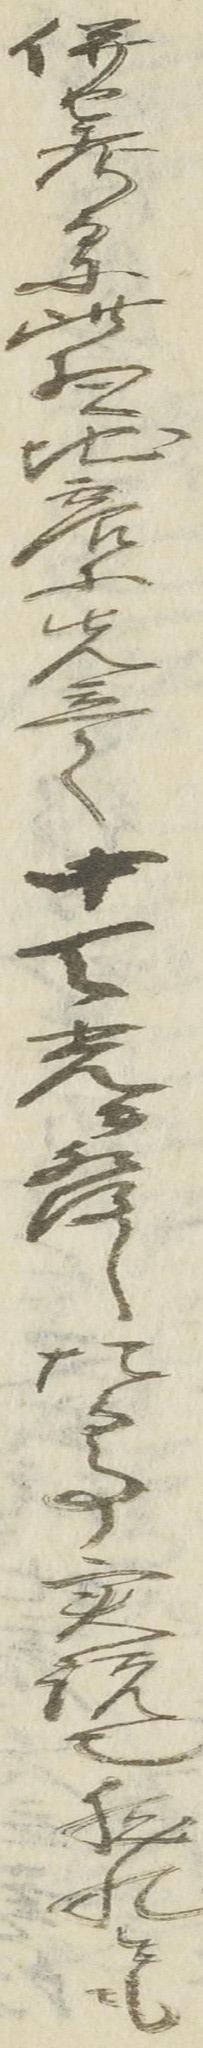併セ考るに此夜地震に先立て中天光ヲ発したる事実説也然れとも
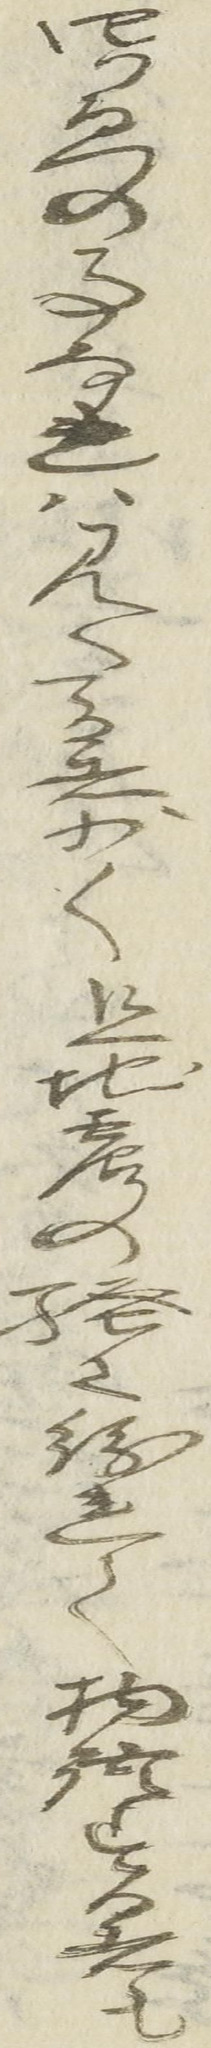四ツ過の事なれハ見たる者少く且地震の騒に紛れて物語する者も
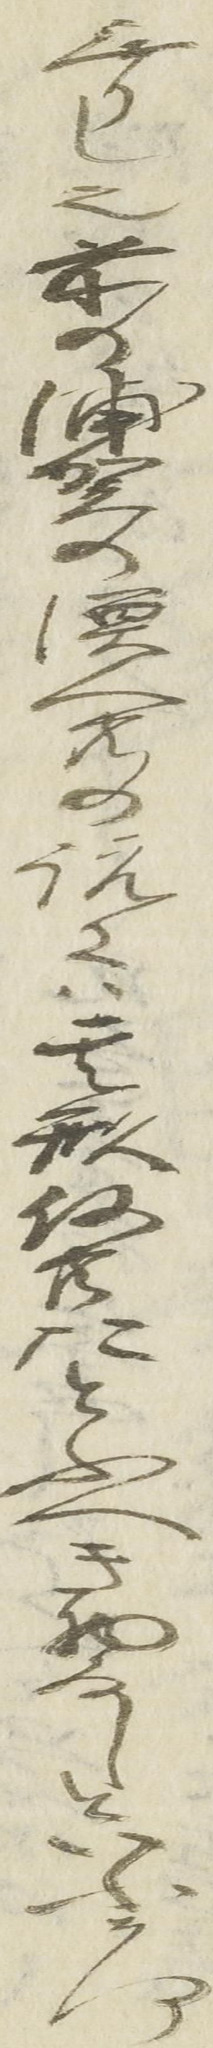無りし也前の浦賀の濱人共の説にハ其形何共たとふへき物なしといふ如何
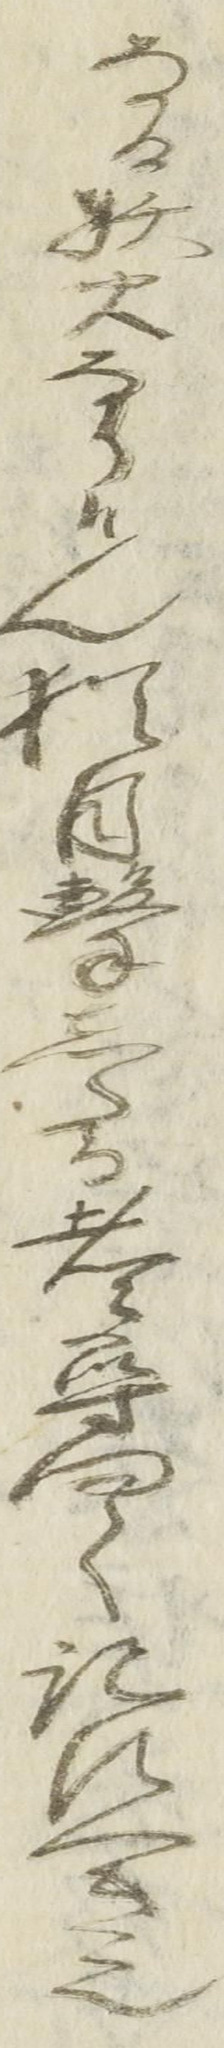なる妖火なり候ん猶目撃したる者ニ尋向〻記すへき也
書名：安政乙卯江戸大地震筆記　安政丙辰八月大阪大雷雨之記追加　安政三辰年七月松前辺大地震并八月大風雨記録
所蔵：東京大学地震研究所図書室 Earthquake Research Institute Library, The University of Tokyo, JAPAN
